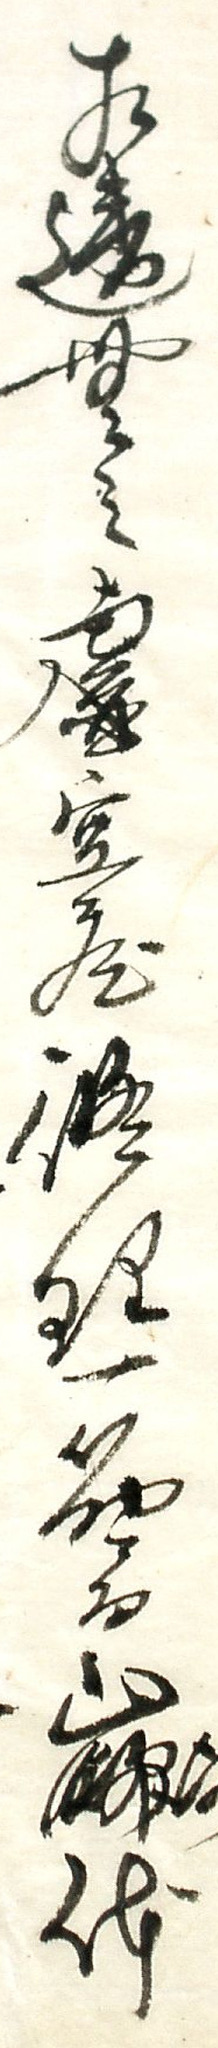相違無之虚空蔵修理一筋ニ而山師体
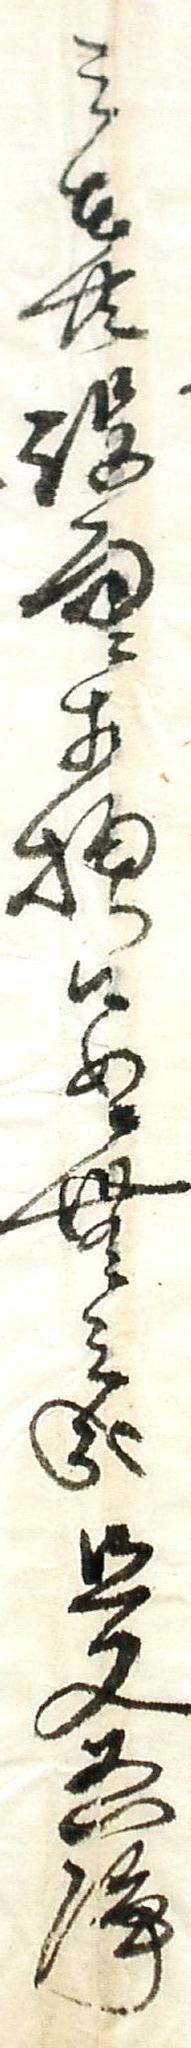之者共役向ニ相拘り候義ニ無之哉且又右浄
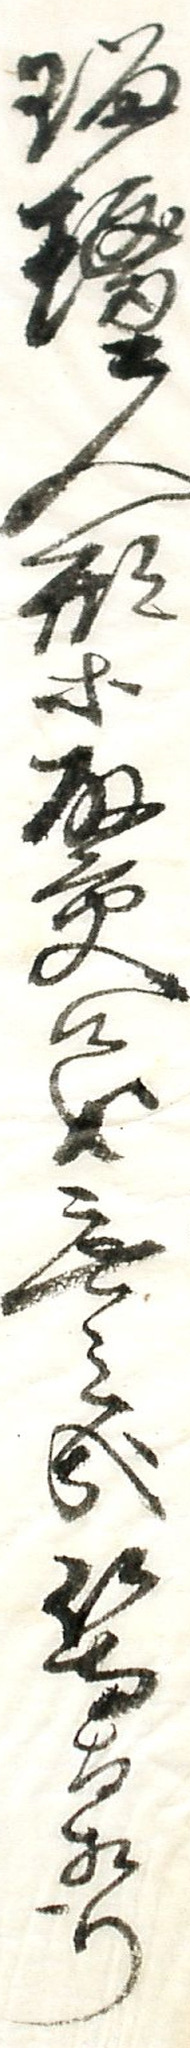瑠璃ニ人形等取交候義無之哉等と相行
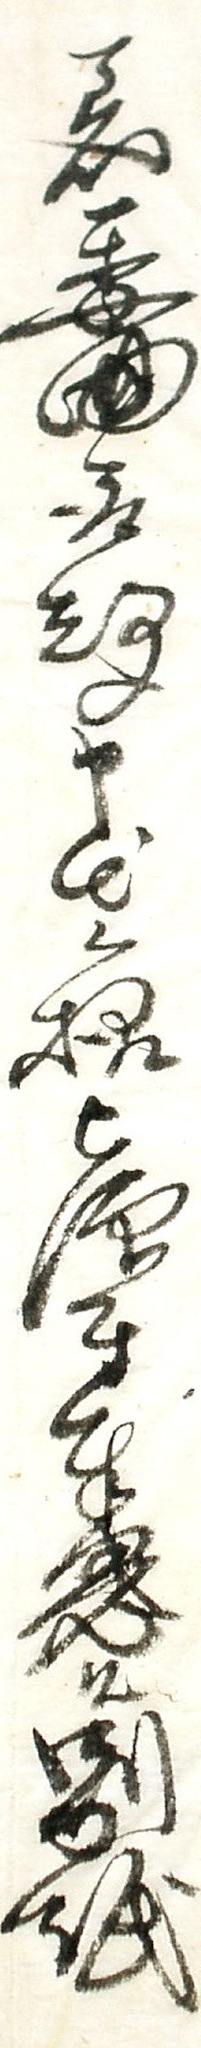着委曲取都メ申出候様被仰付奉畏候別紙
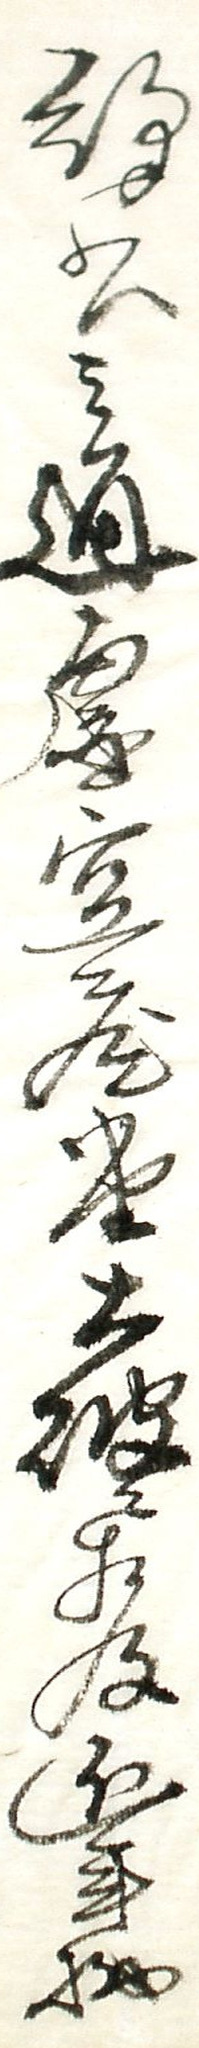都メ書之通虚空蔵堂大破ニ相及近年柄
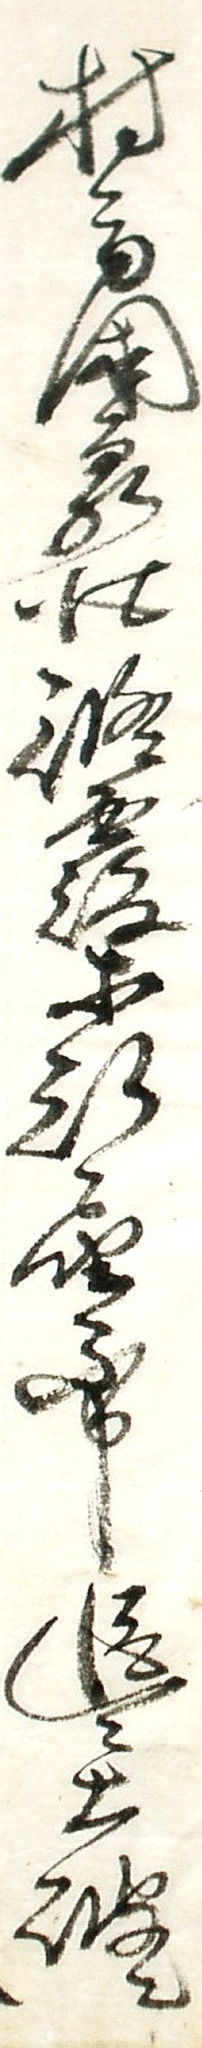村方困窮仕修覆等行届不申追々大破ニ
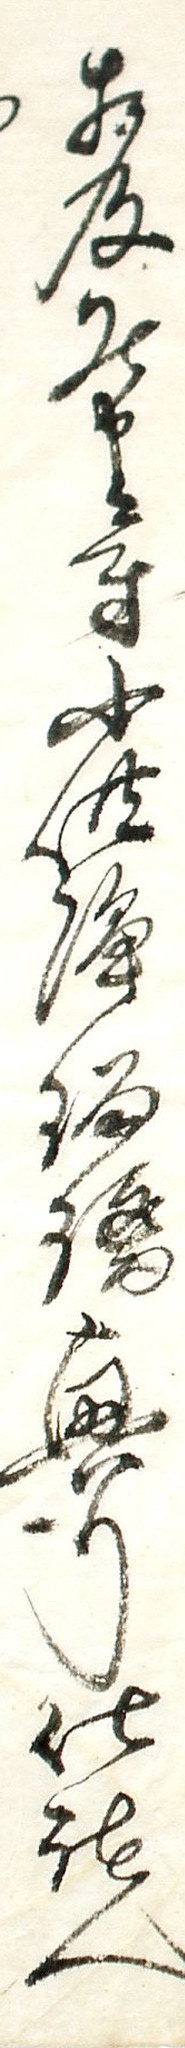相及居申ニ付小供浄瑠璃興行仕諸人
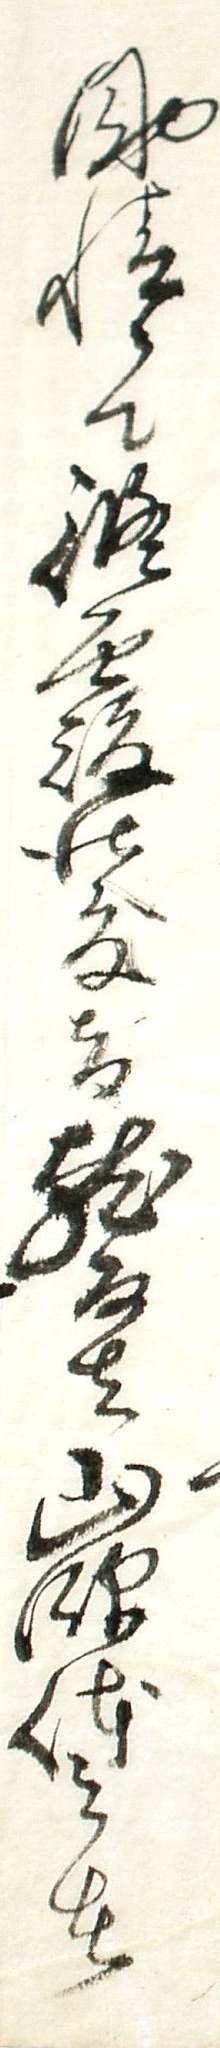助情ニて修覆仕度旨就而者山師体之者
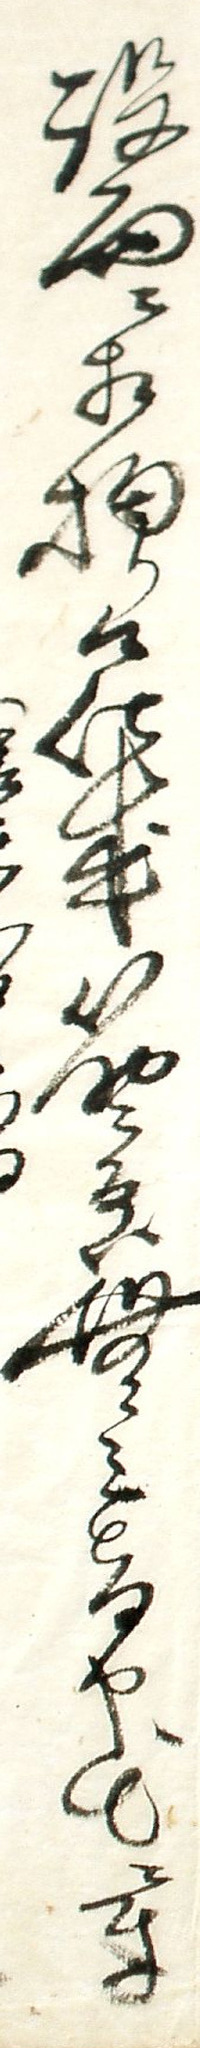役向ニ相拘り候仕成筋ニ而ハ無之旨申出ニ付
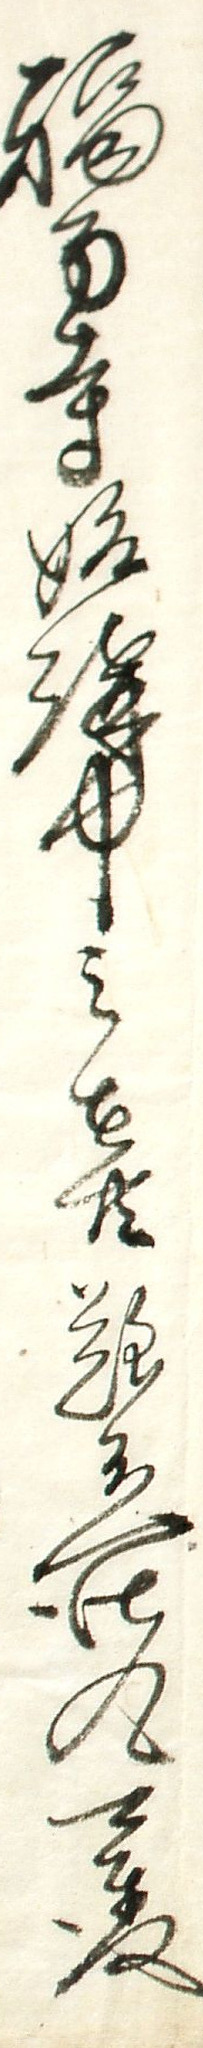福万寺始講中之者共難有仕合可奉存候
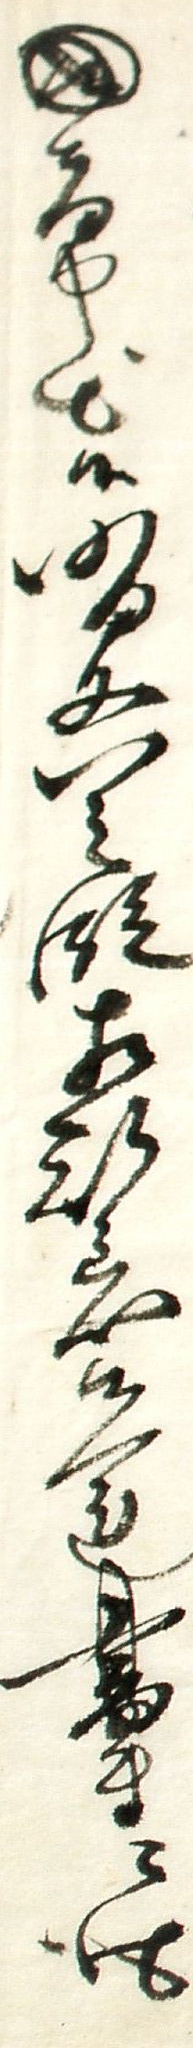旨申出候仍而右之段相行着候運書付ニ仕
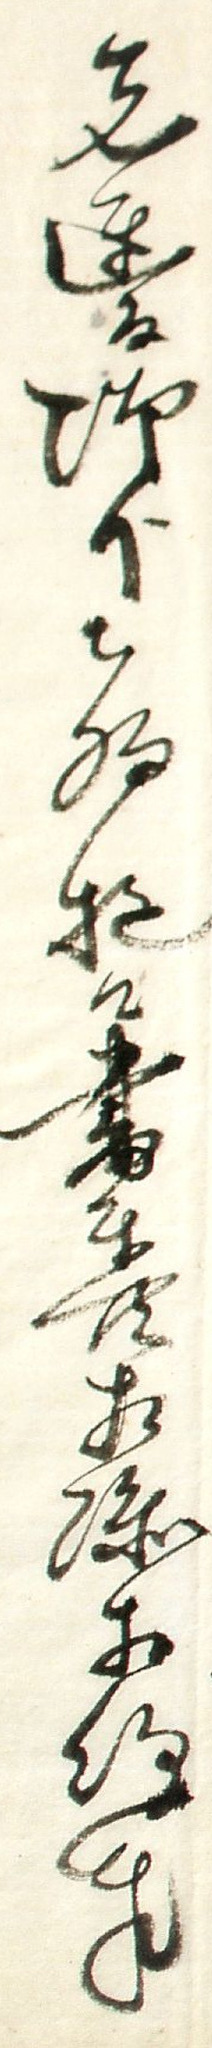先達而仰下被為遊候書付共相添相都メ奉
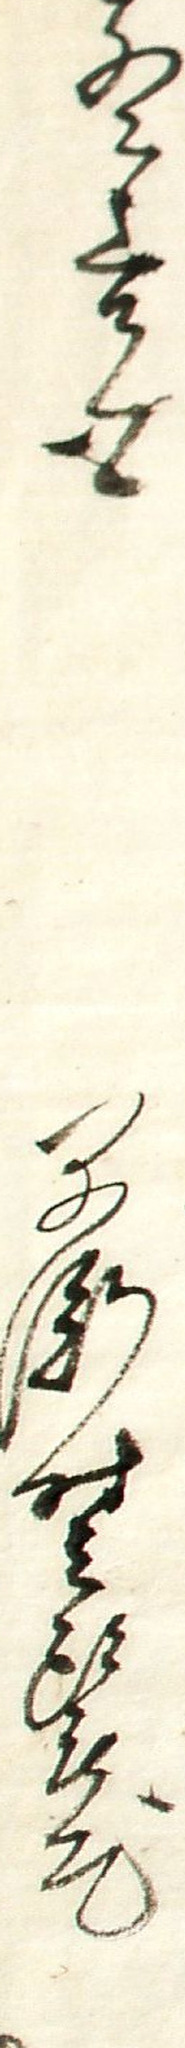差上候以上早渕村与頭庄屋
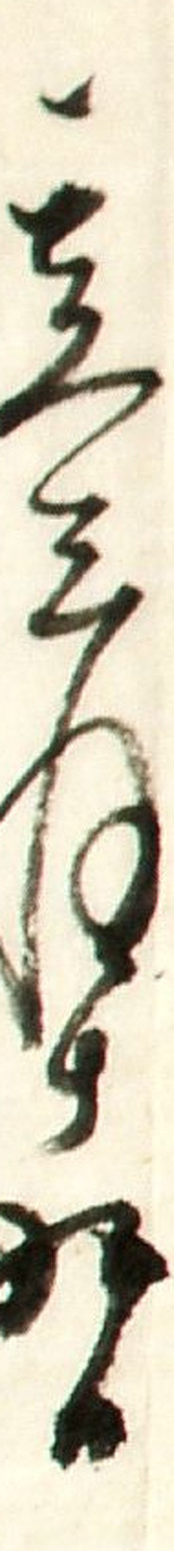亥三月十九日

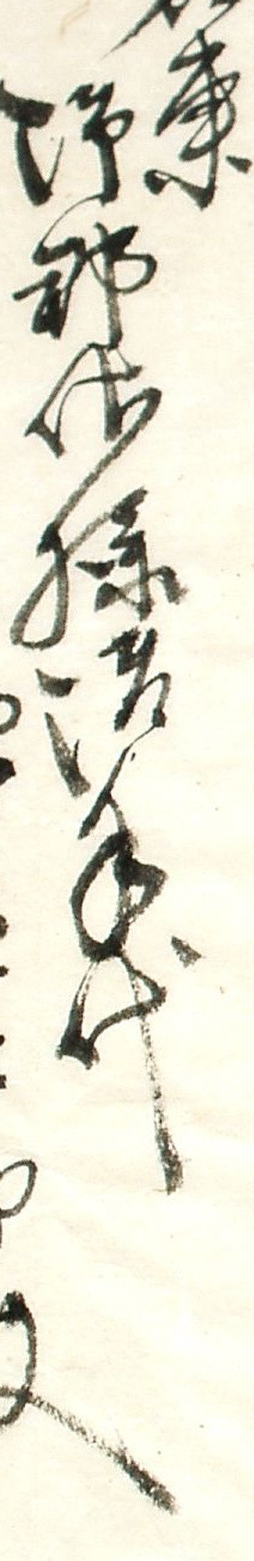御郡代様御手代
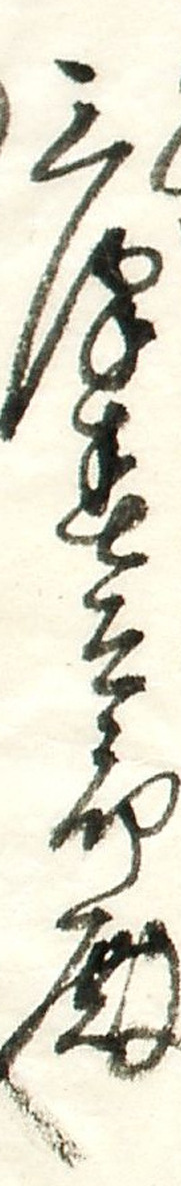三澤春太郎殿
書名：(早渕村福満寺子ども浄瑠璃願紙面）他
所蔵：鳴門教育大学 Naruto University of Education
